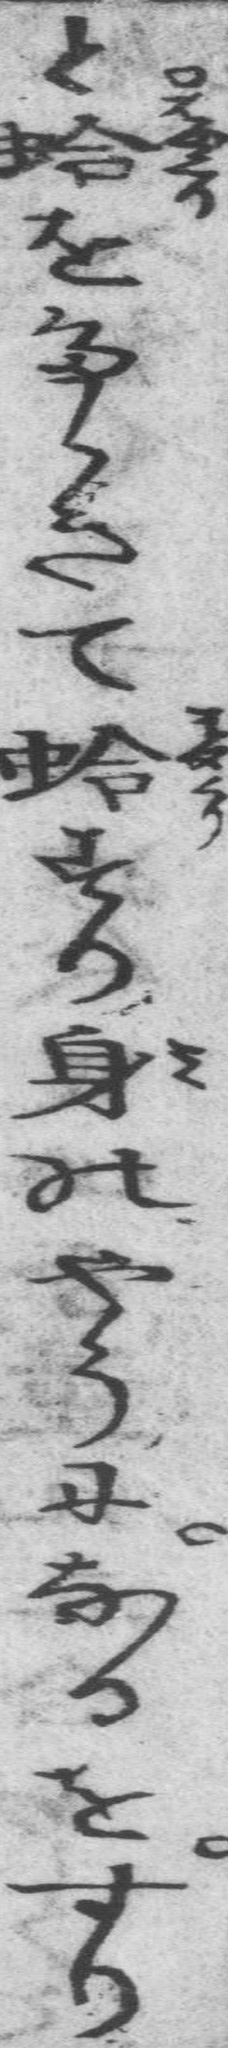と。蛤をたゝきて蛤すり身のやうに。なるを。すり

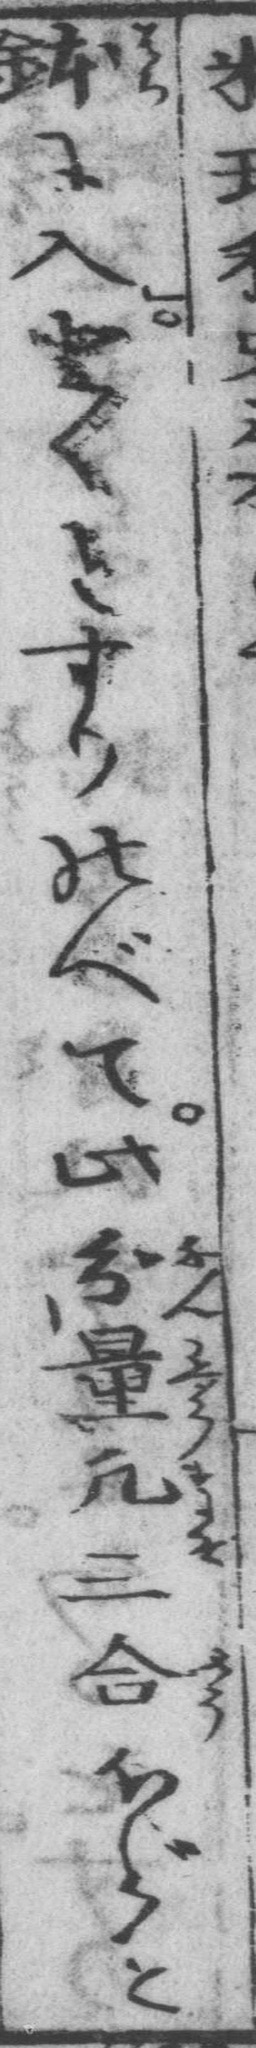鉢に入れ。とくとすりのべて。此分量凡三合ほども
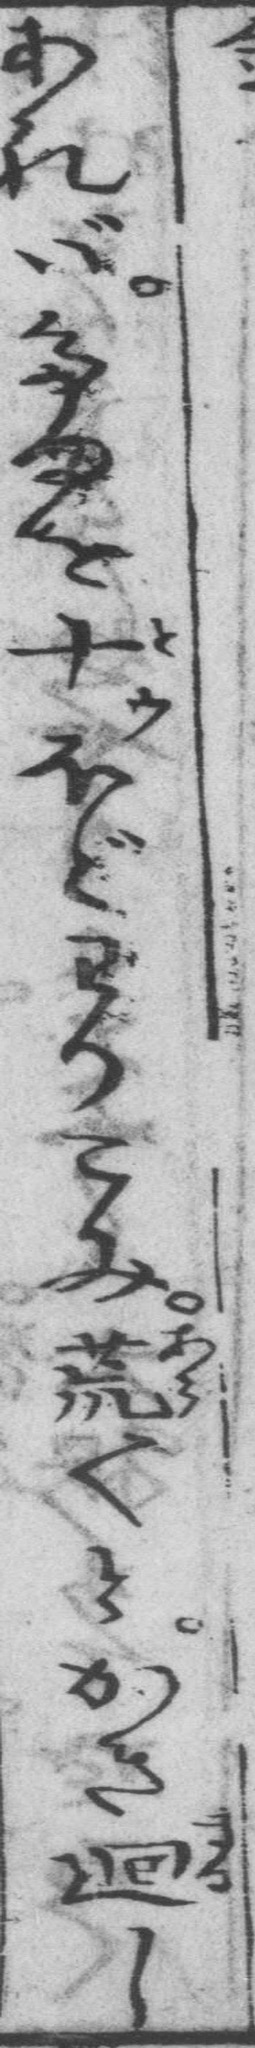あれば。たまを十ウほどわりこみ。荒〳〵と。かき廻し
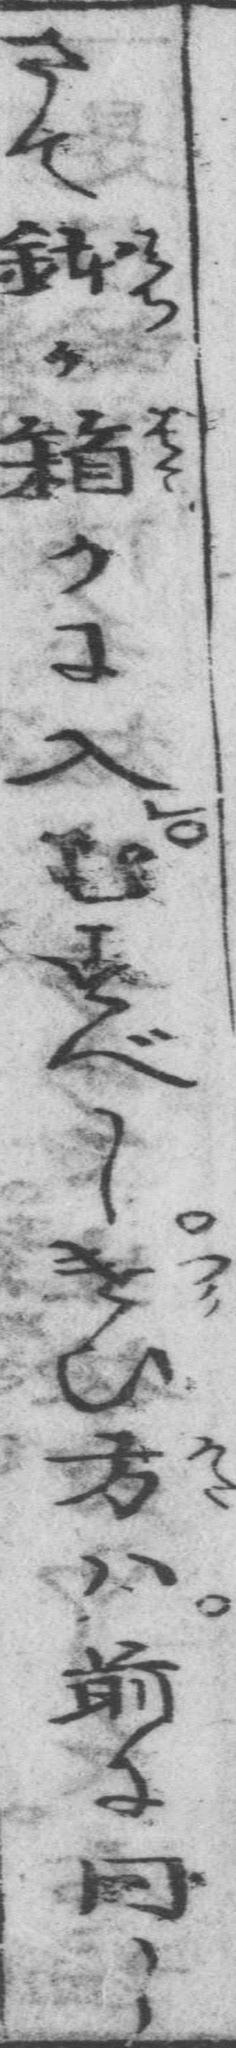さて鉢か箱かに入れ。むすべし。遣ひ方は。前に同し
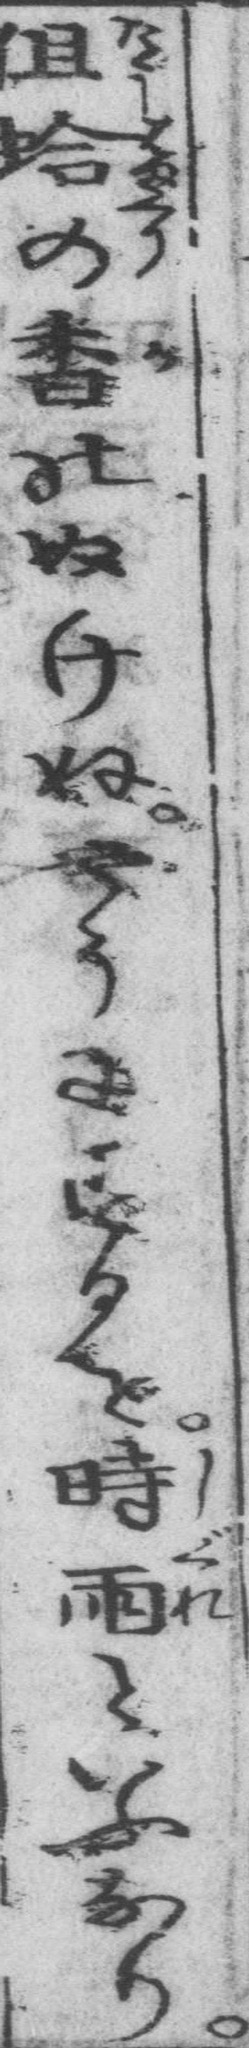但蛤の香のぬけぬ。やうにするを。時雨といふなり。
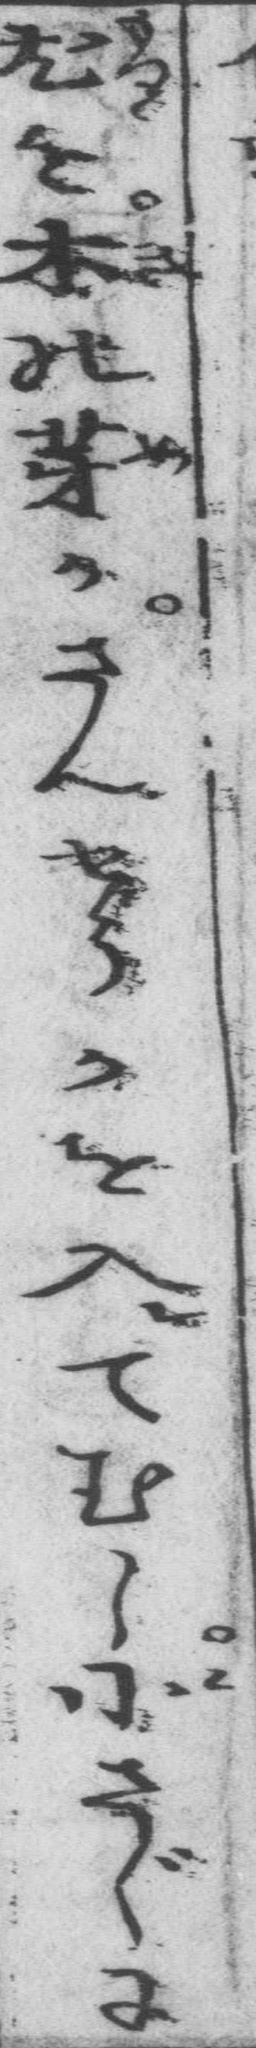尤も。木の芽か。さんせうかを入れてむし。小さじに
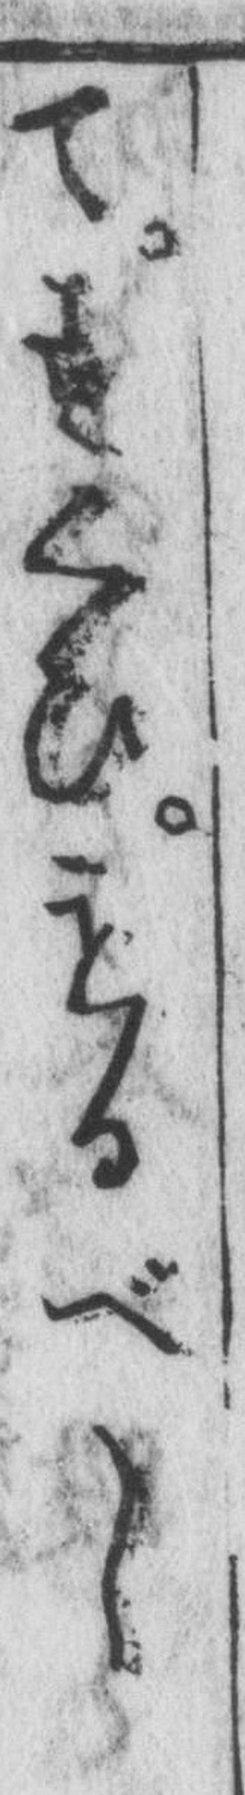て。すくひ。もるべし
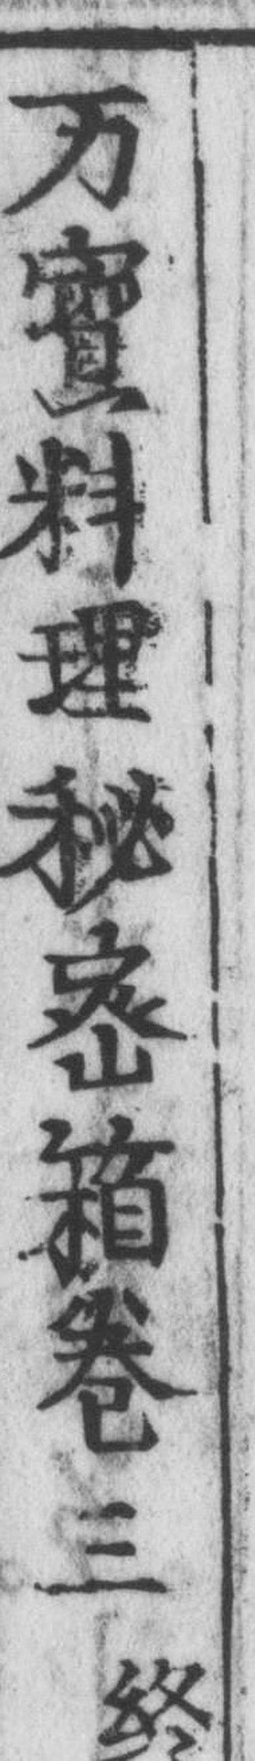万宝料理秘密箱巻三終

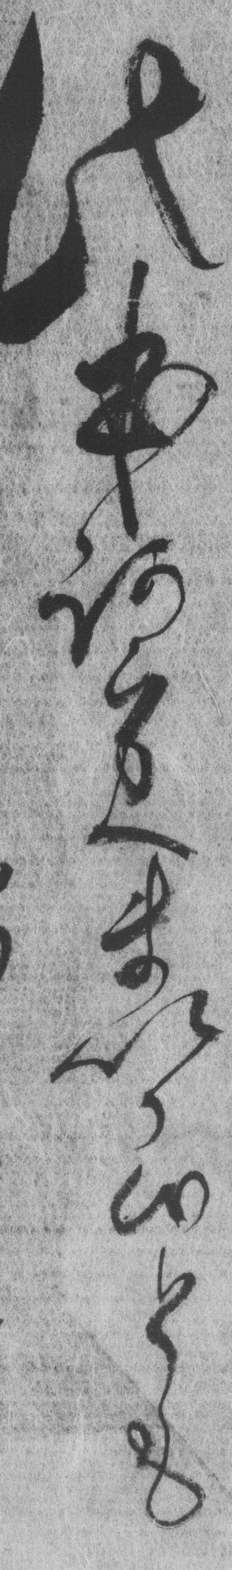此本何方へまいり候とも
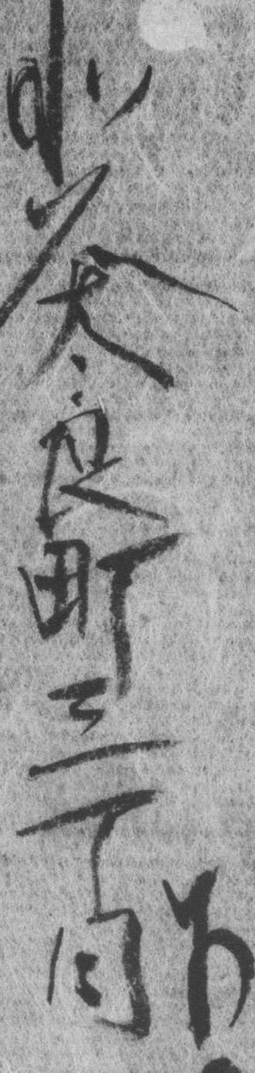北奈良町三丁目
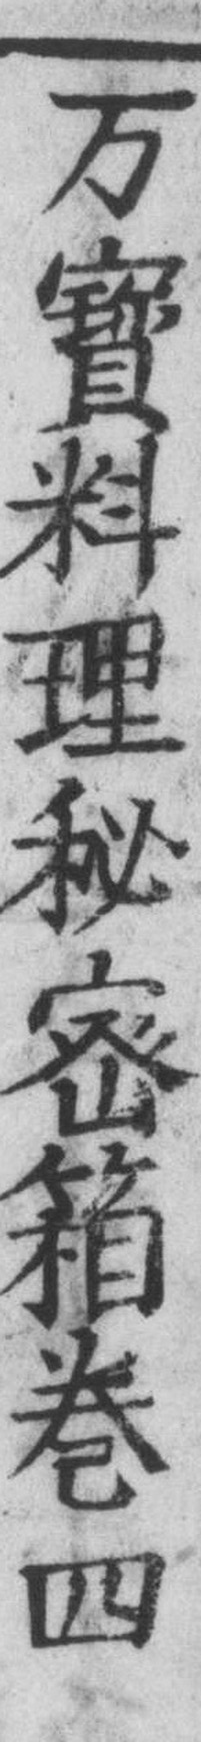万宝料理秘密箱巻四
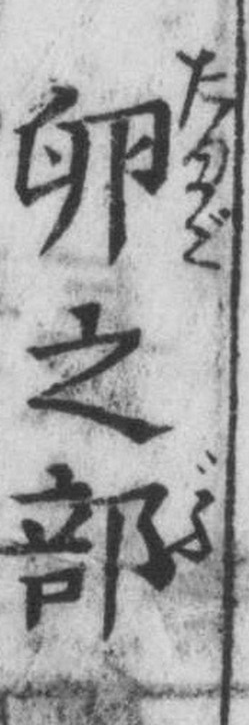卵の部
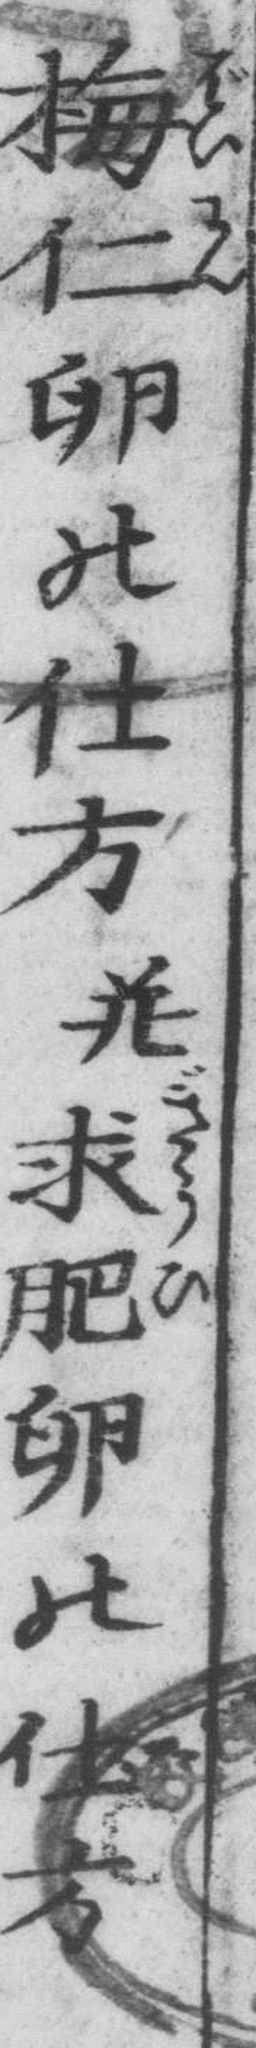梅仁卵の仕方并求肥卵の仕方
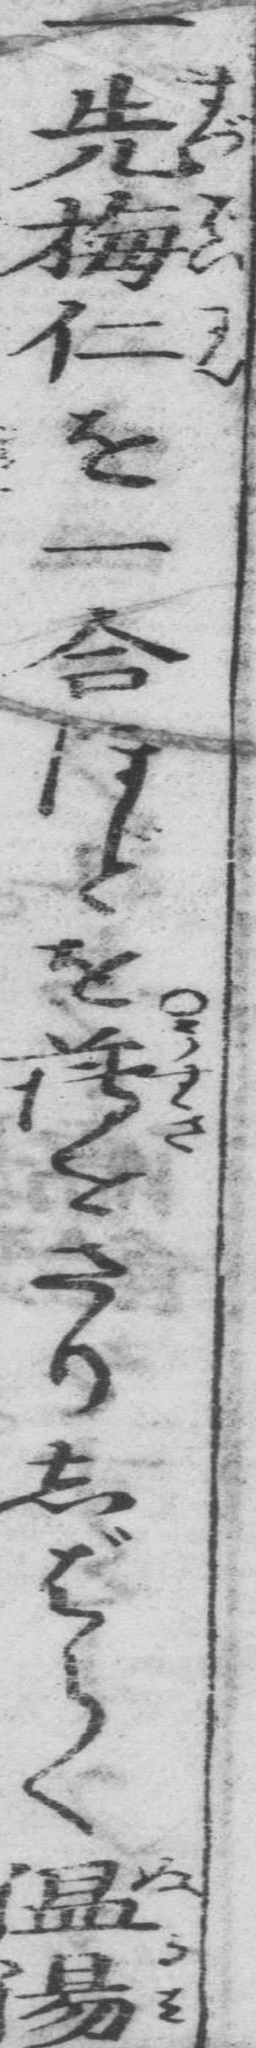一先梅仁を一合ほとを。薄をさりしばらく温湯
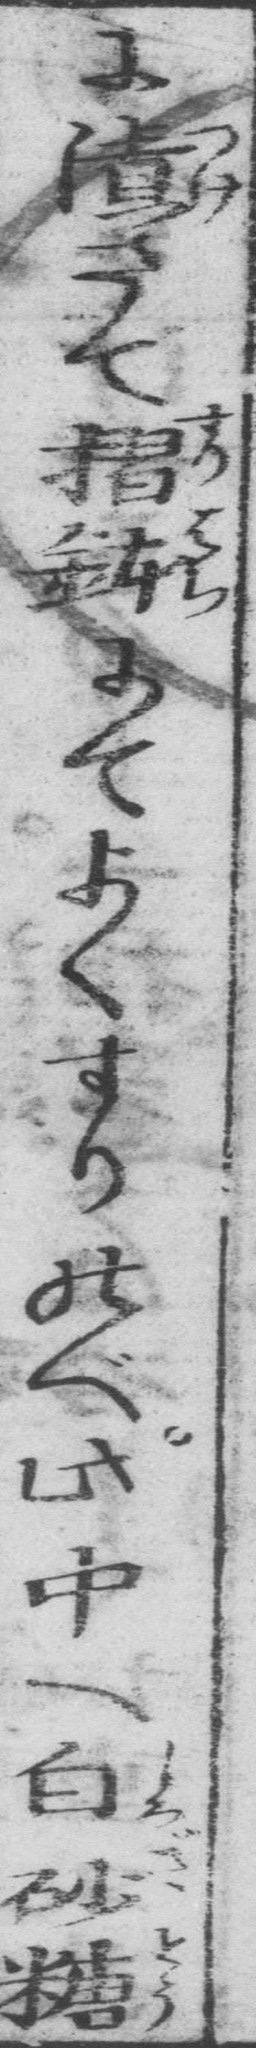に漬さて摺鉢にてよくすりのべ。此中へ白砂糖
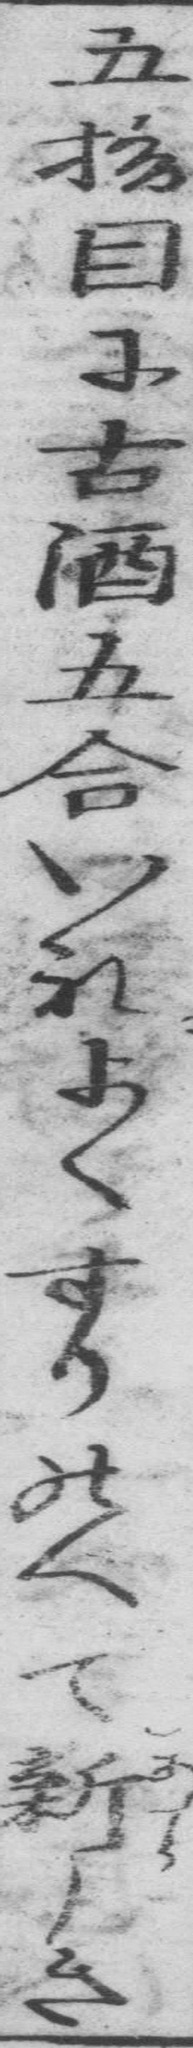五拾目に古酒五合いれ。よくすりのへて。新しき
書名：萬寳料理秘密箱
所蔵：大阪府立大学学術情報センター 国文学研究資料館
